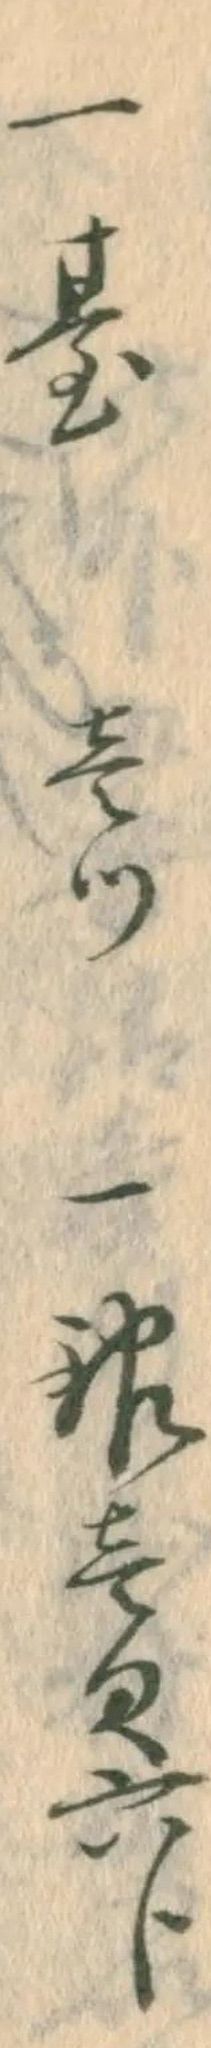一台壱ツ一銀壱匁六分
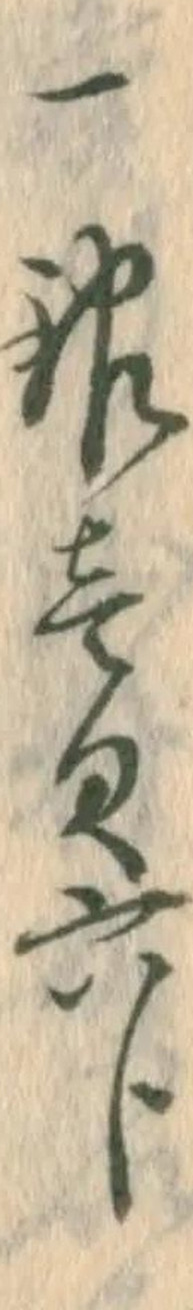一銀壱匁六分
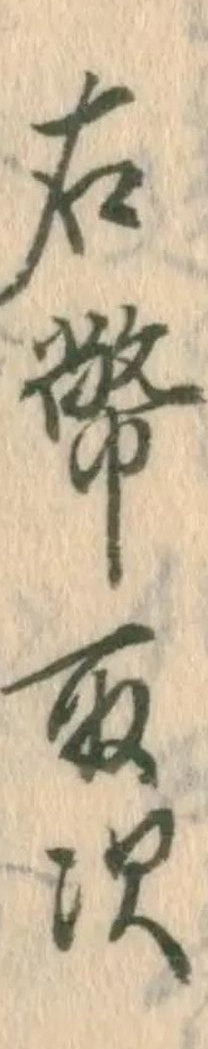右幣取次
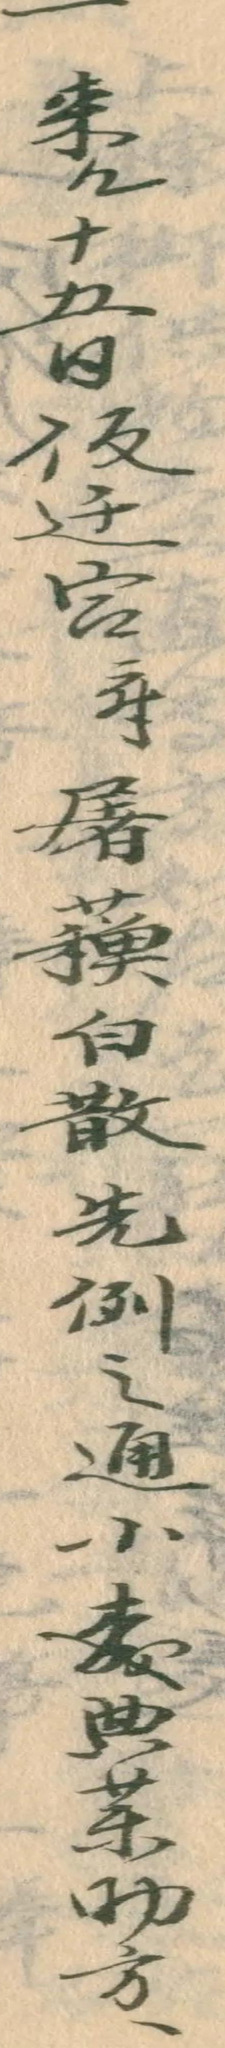一来ル十五日仮迁宮ニ付屠蘇白散先例之通小森典薬助方へ
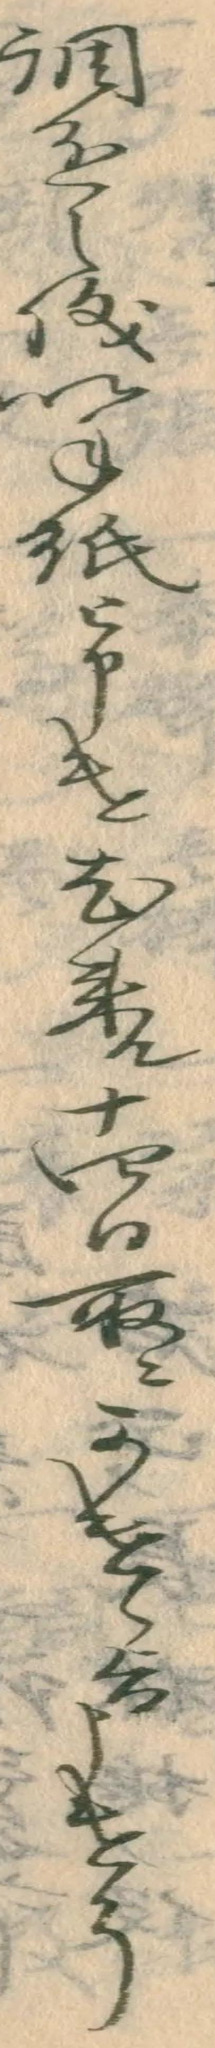調進之儀以手紙被申遣尤来ル十四日取ニ可遣候旨申遣候也
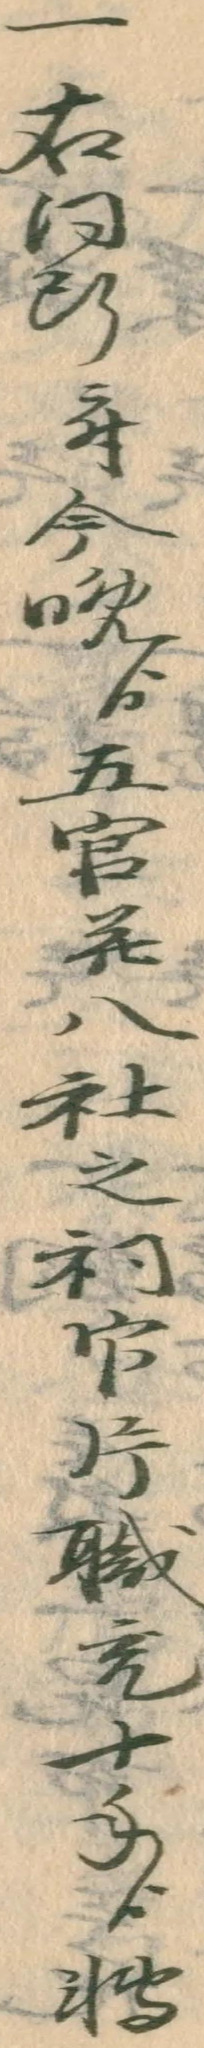一右同断ニ付今晩ゟ五官并八社之祠官片職充十手ゟ転
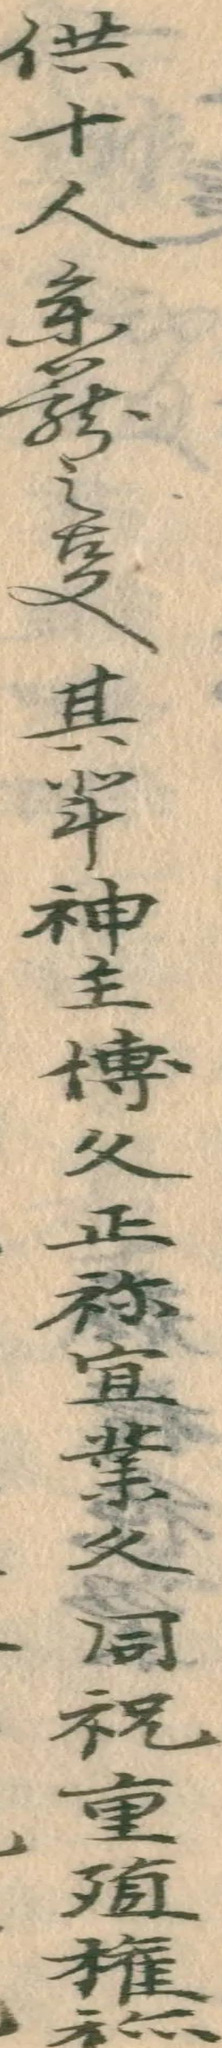供十人参籠之事其輩神主博久正祢宣業久同祝重殖権祢
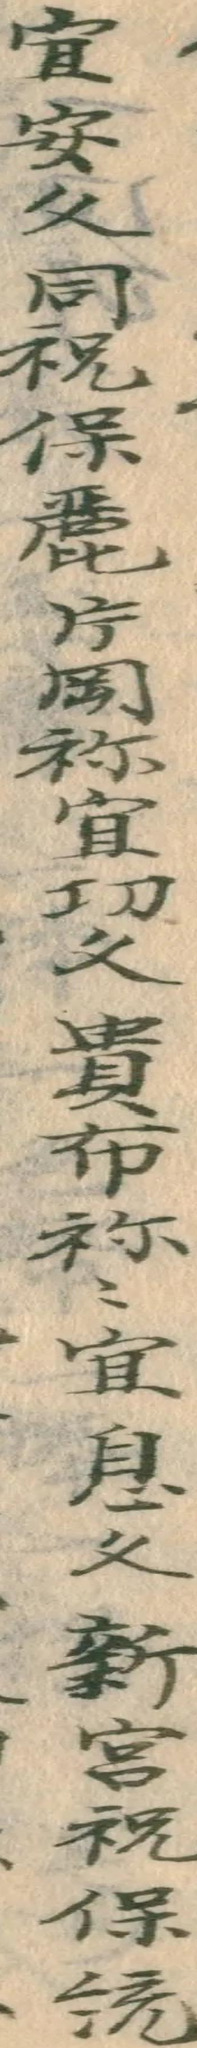宣安久同祝保麗片岡祢宜功久貴布祢々宜息久新宮祝保統
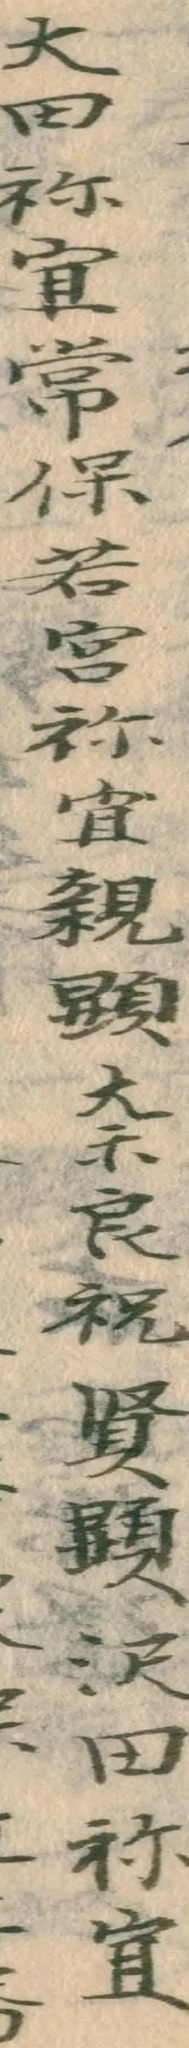大田祢宜常保若宮祢宜親顕奈良祝賢顕沢田祢宜
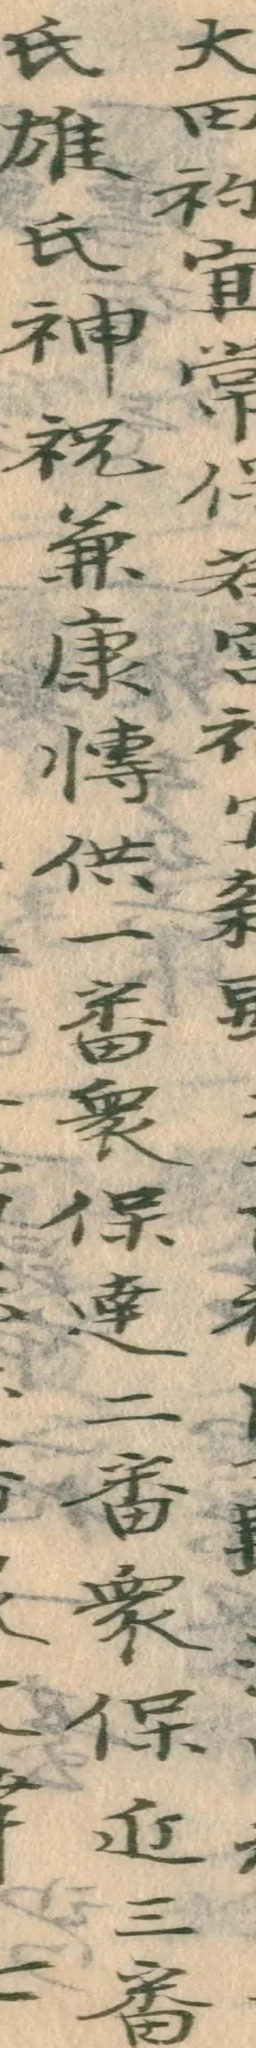氏雄氏神祝兼康転供一番衆保達二番衆保近三番
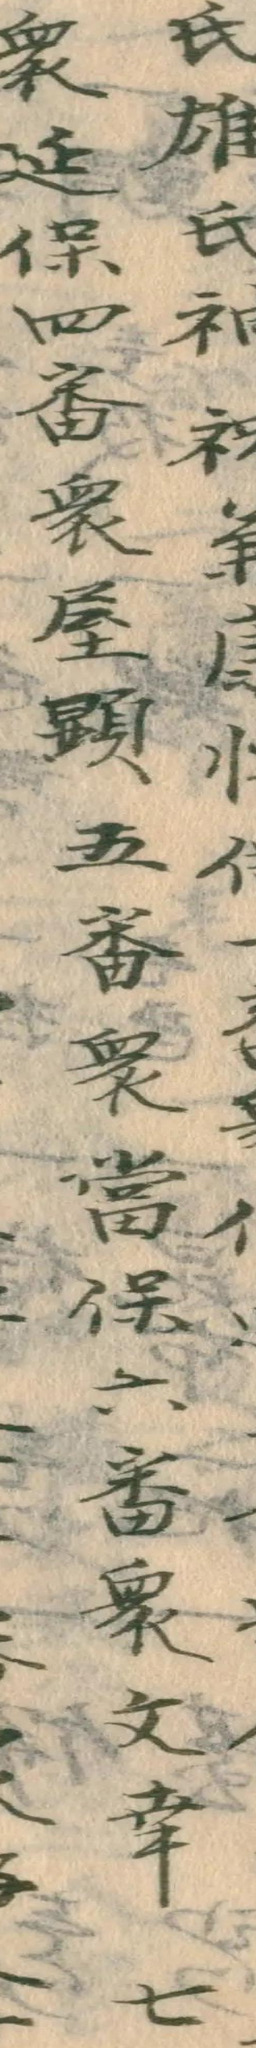衆延保四番衆屋顕五番衆当保六番衆文幸七
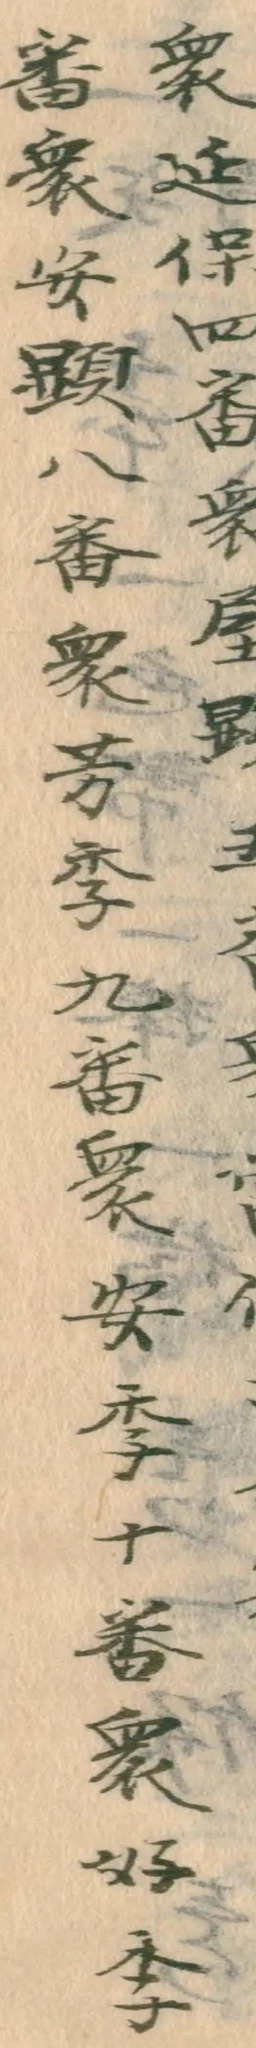番衆安顕八番衆芳季九番衆安季十番衆好季
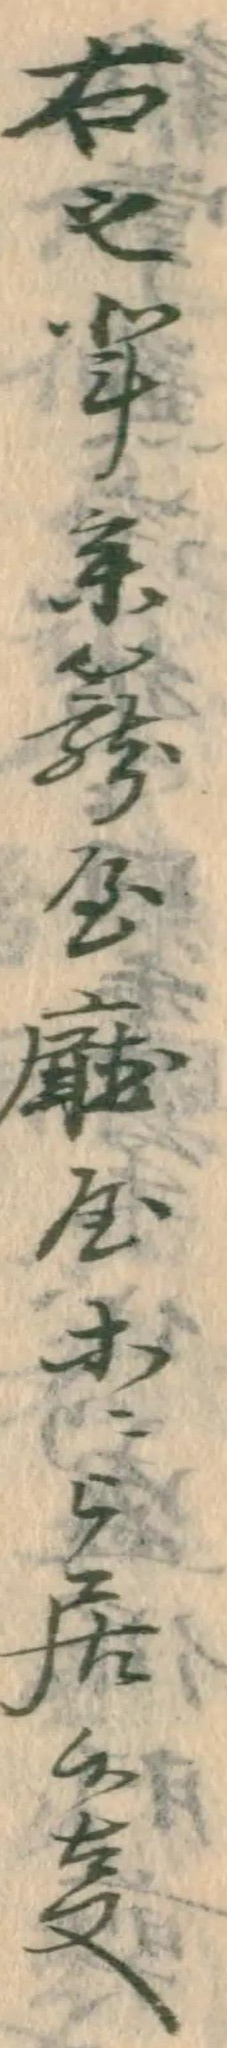右之輩参籠屋庁屋等ニ被居候事
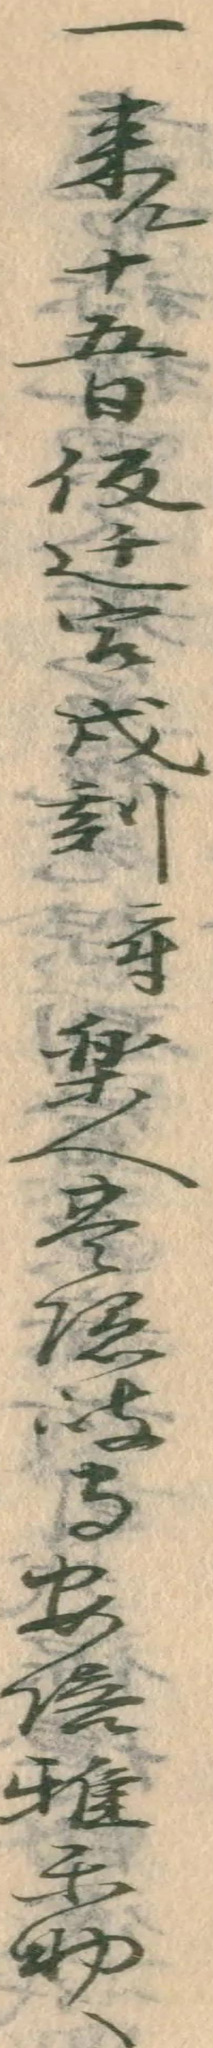一来ル十五日仮迁宮戌刻ニ付楽人豊隠岐守安倍雅楽助へ
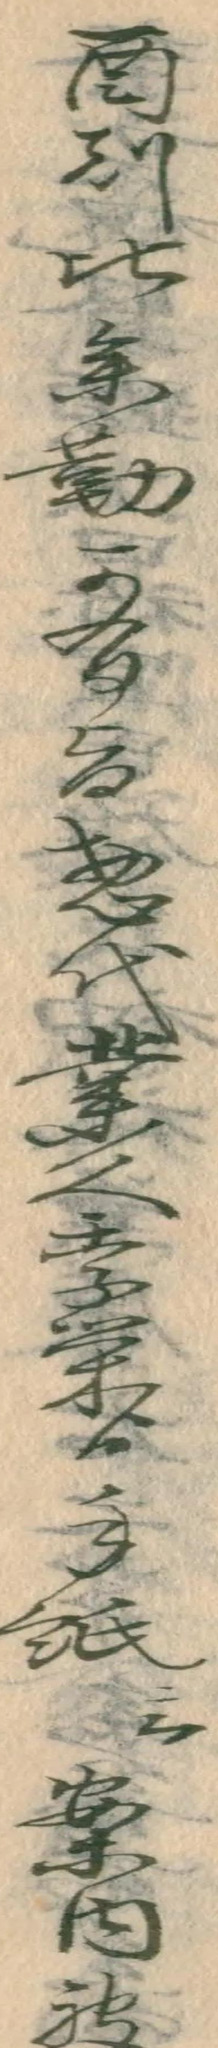酉刻比参勤可有旨惣代業久季栄ゟ手紙ニ而案内被
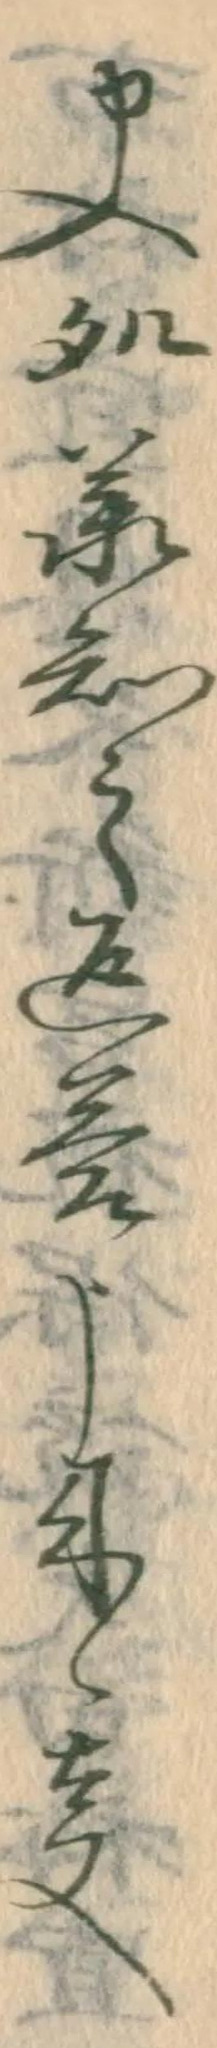申入処承知之返答申来候事
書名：賀茂社記録. 第17冊
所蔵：国立国会図書館 National Diet Library, JAPAN
